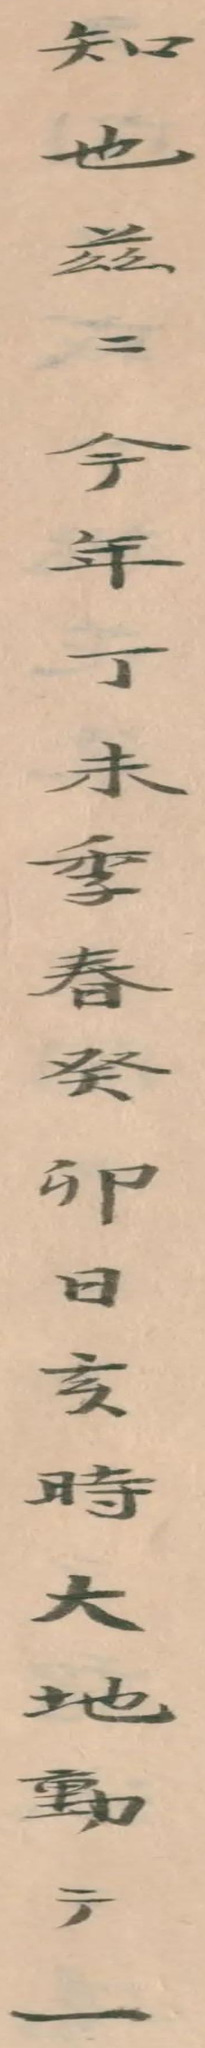知也茲ニ今年丁未季春癸卯日亥時大地動テ一
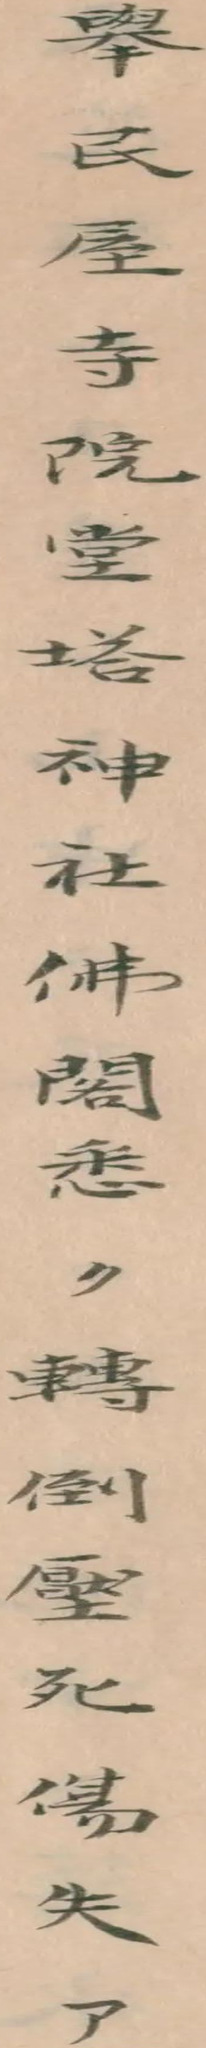挙民屋寺院堂塔神社仏閣悉ク転倒圧死傷失ア
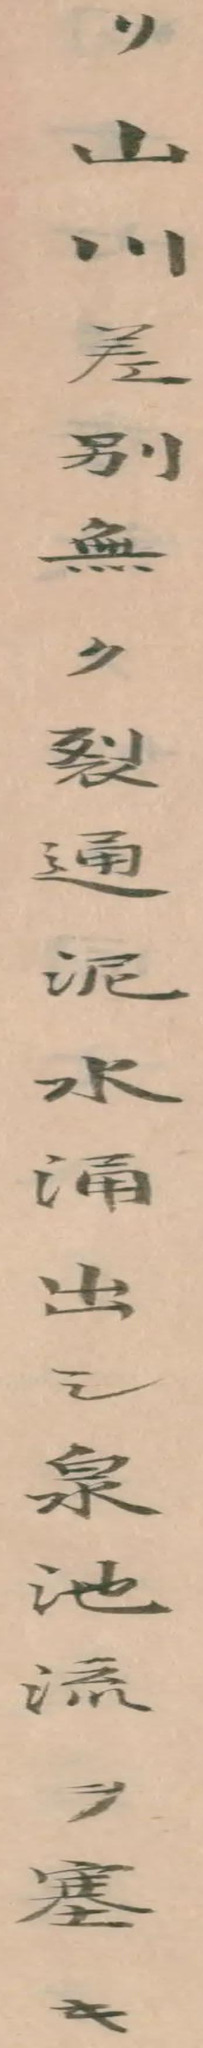リ山川差別無ク裂通泥水涌出シ泉池流ヲ塞キ
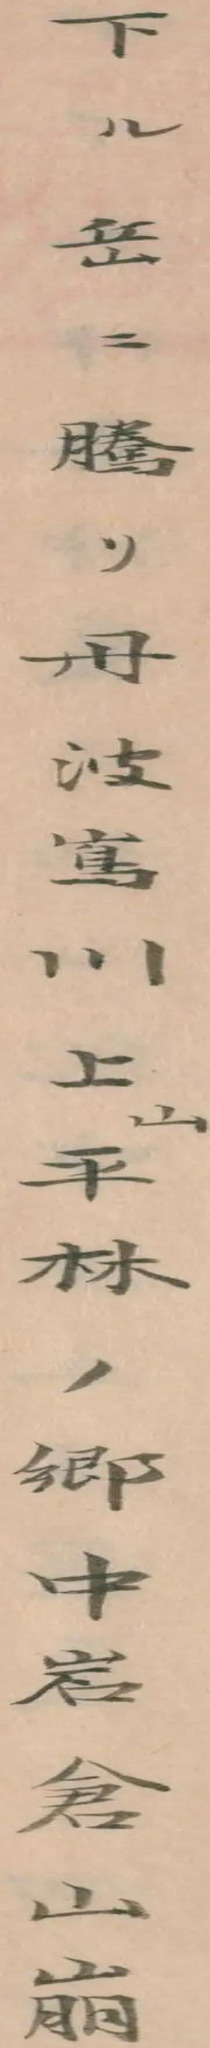下ル岳ニ騰リ丹波嶌川上山平林ノ郷中岩倉山崩
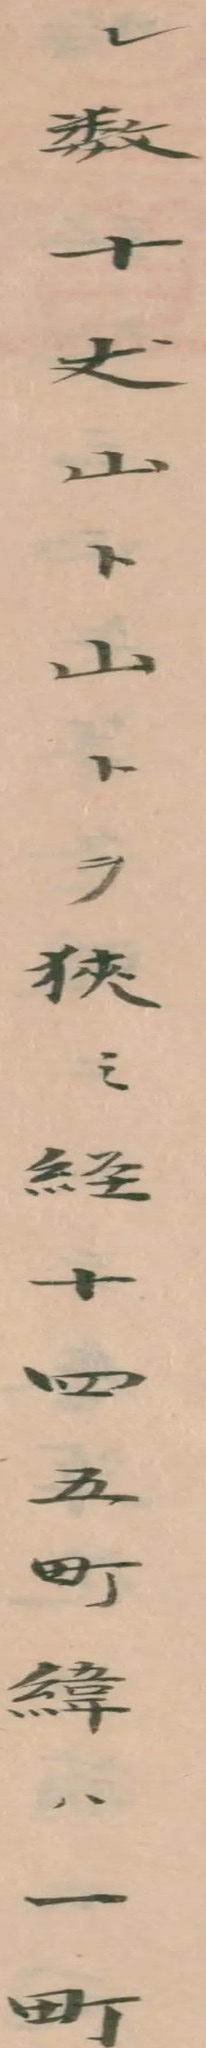レ数十丈山ト山トヲ挟ミ経十四五町緯ハ一町
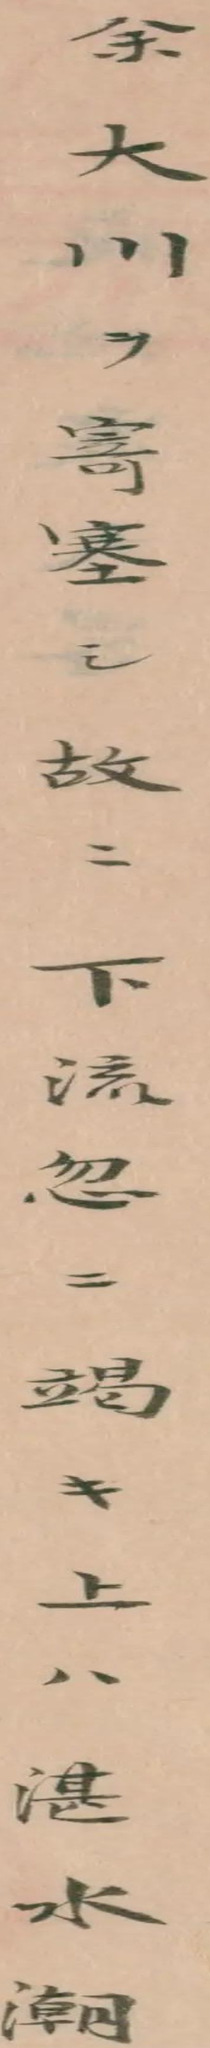余大川ヲ寄塞シ故ニ下流忽ニ竭キ上ハ湛水潮
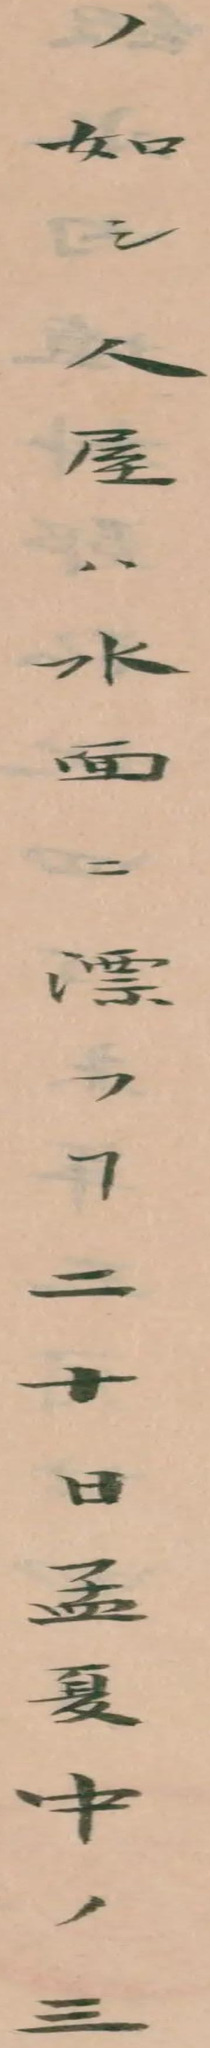ノ如シ人屋ハ水面ニ漂フコト二十日孟夏中ノ三
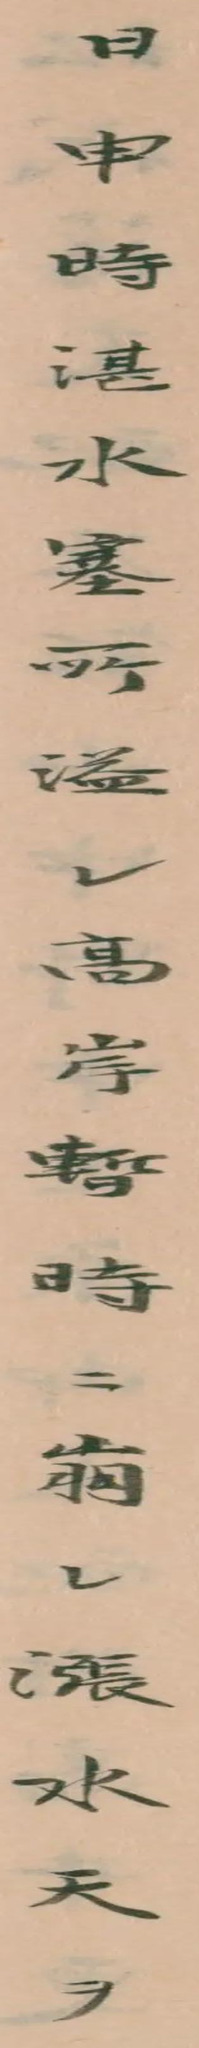日申時湛水塞所溢レ高岸暫時ニ崩レ漲水天ヲ
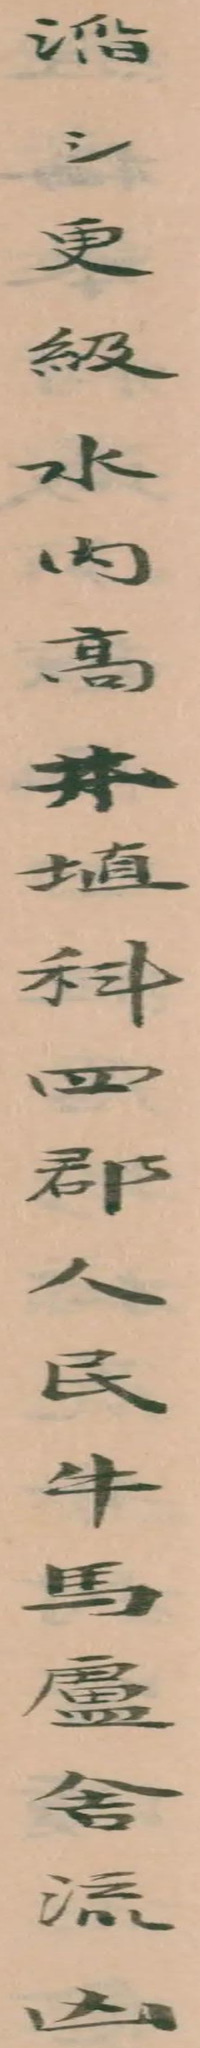滔シ更級水内高井埴科四郡人民牛馬盧舎流凶
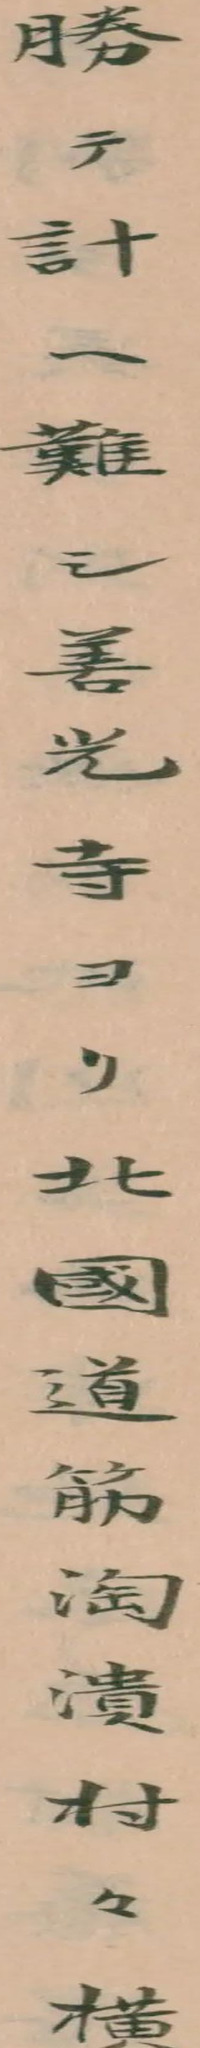勝テ計ヘ難シ善光寺ヨリ北国道筋淘潰村々横
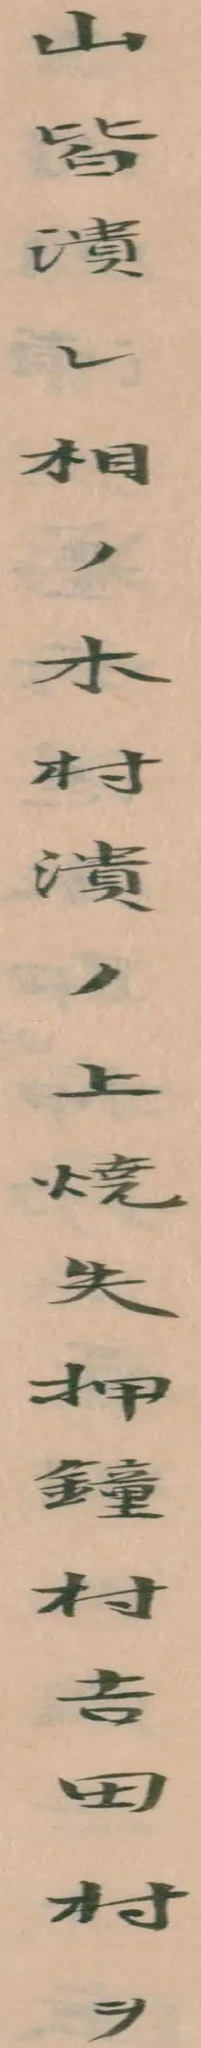山皆潰相ノ木村潰ノ上焼失押鐘村吉田村ヲ
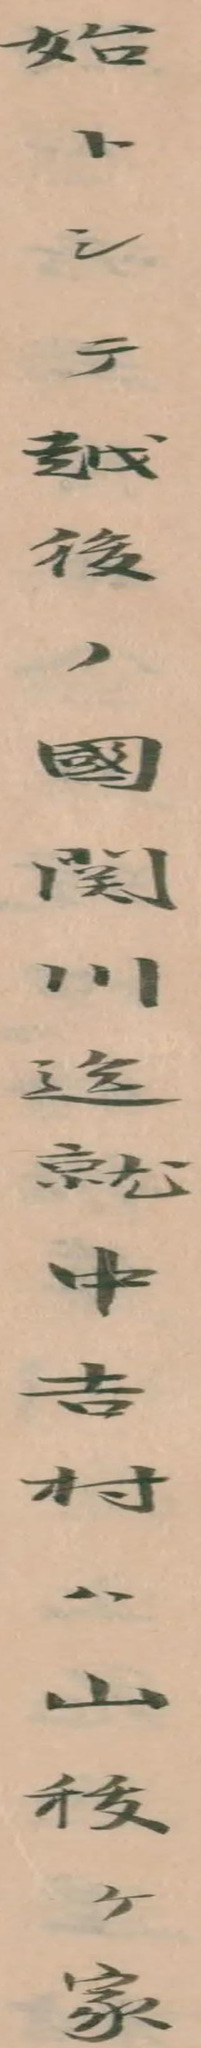始トシテ越後ノ国関川迄就中吉村ハ山抜ケ家
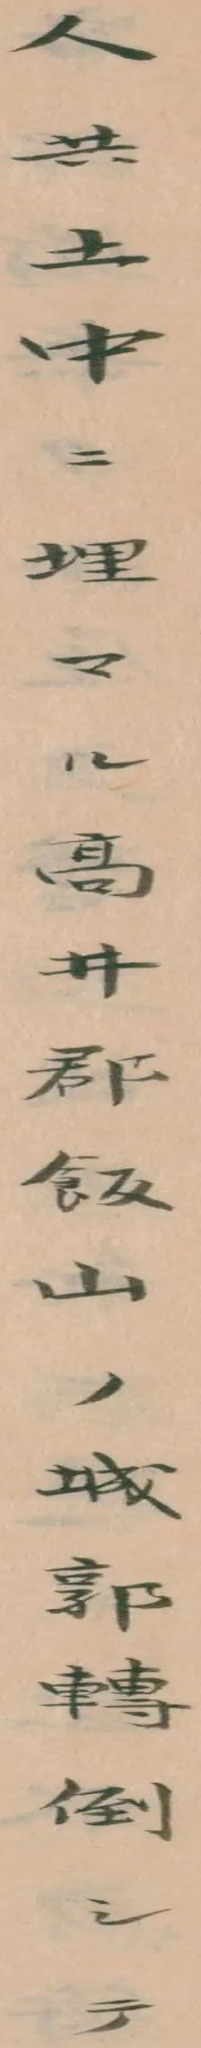人共土中ニ埋マル高井郡飯山ノ城郭転倒シテ
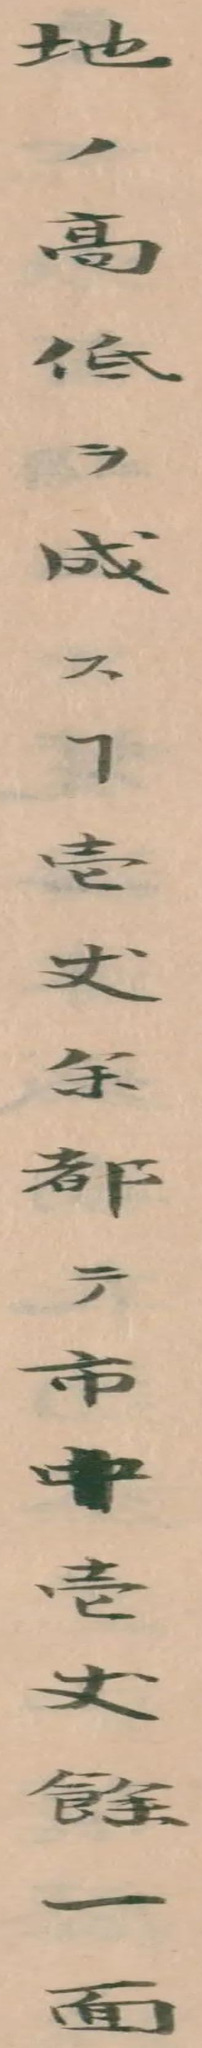地ノ高低ヲ成スコト壱丈余都テ市中壱丈余一面
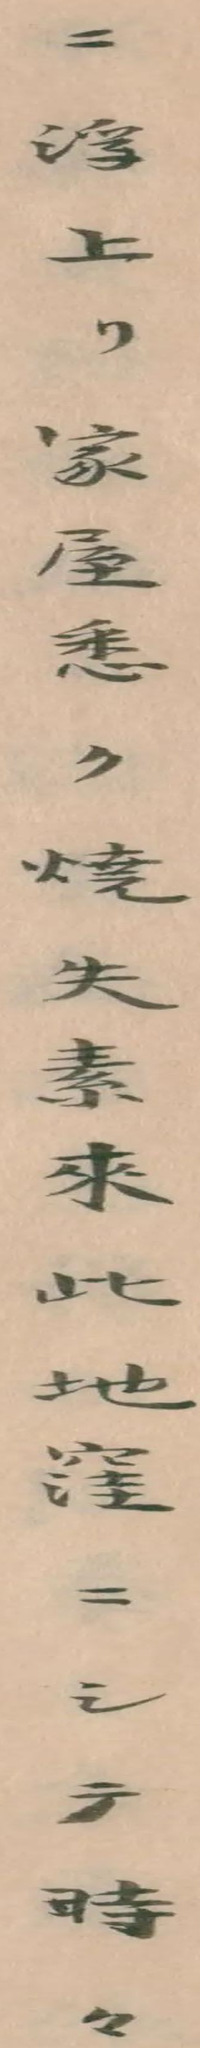ニ浮上リ家屋悉ク焼失素来此地窪ニシテ時々
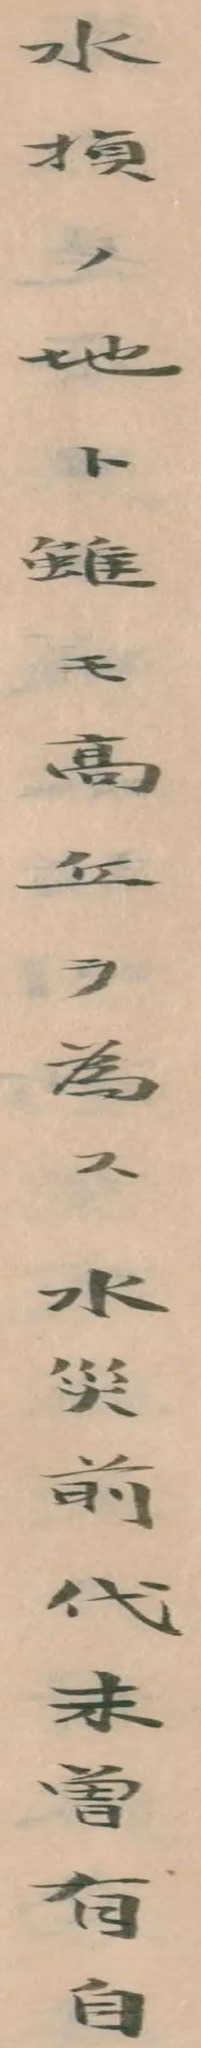水損ノ地ト雖モ高丘ヲ為ス水災前代未曽有自
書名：地災撮要. 巻5-6(地震之部)
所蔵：国立国会図書館 National Diet Library, JAPAN
